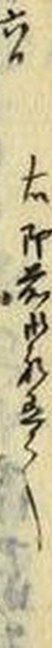右御前御礼有之
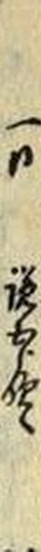一同謙五郎様へ
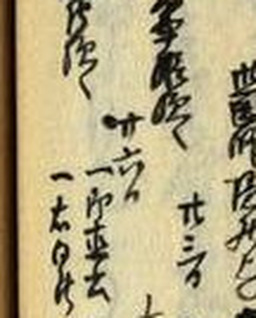廿六日
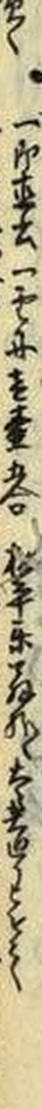一御直書一雲丹壱壺五合松平楽翁様へ大奥廻り被進之
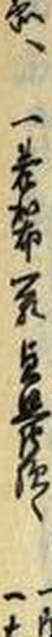一若和布一箱貞照院様へ
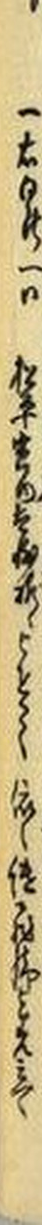一右同断一同松平宮内太輔様へ被進之依之継飛脚を差立候
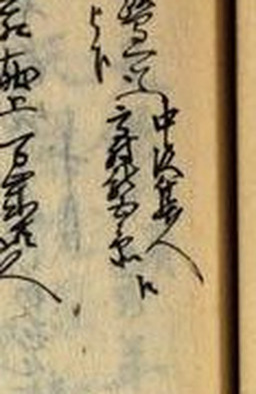高村新五兵衛江
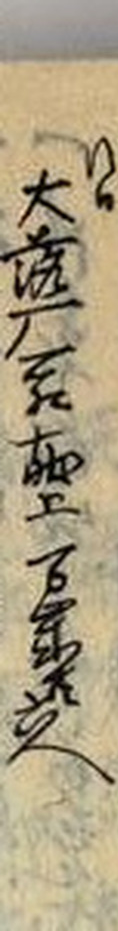大落雁一箱献上万歳共六人
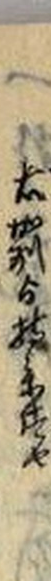右加州ゟ持参仕候由
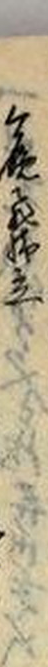今晩飛脚立
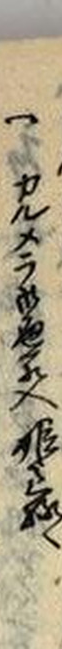一カルメラ御通箱入姫君様へ
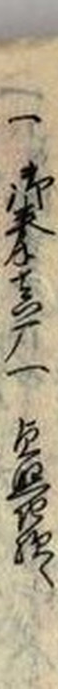一御拳真雁一貞照院様へ
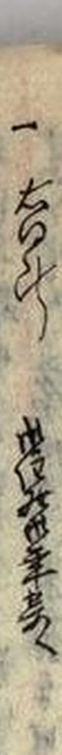一右同断御住居御年寄へ
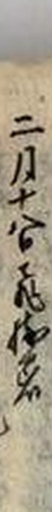二月十八日飛脚着
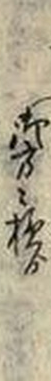御方々様ゟ
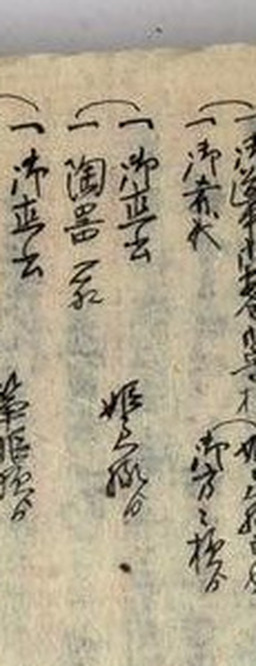一御返書姫君様へ
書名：少傅日録抄（斉承付側向頭取日記、在国）
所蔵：福井県文書館 Fukui Prefectural Archives
